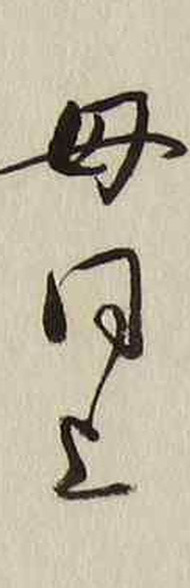母同上
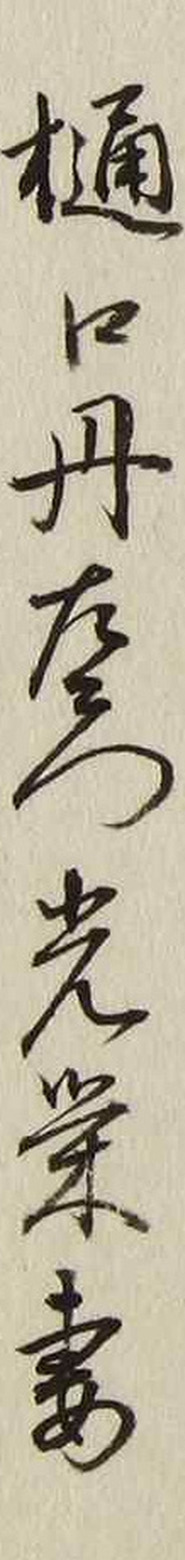女樋口丹左衛門光栄妻
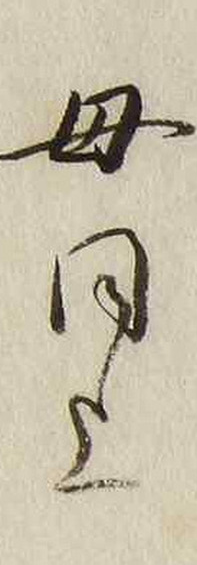母同上

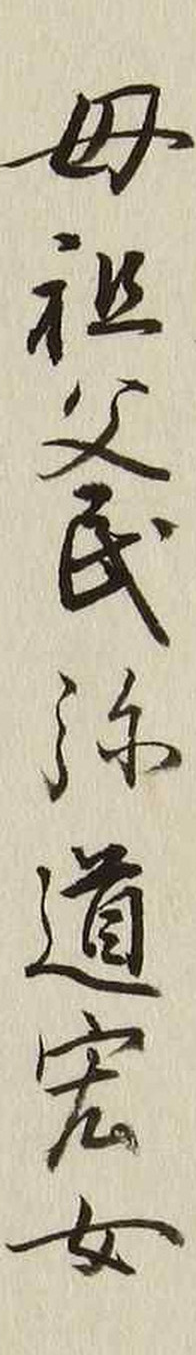母祖父民弥道宏女
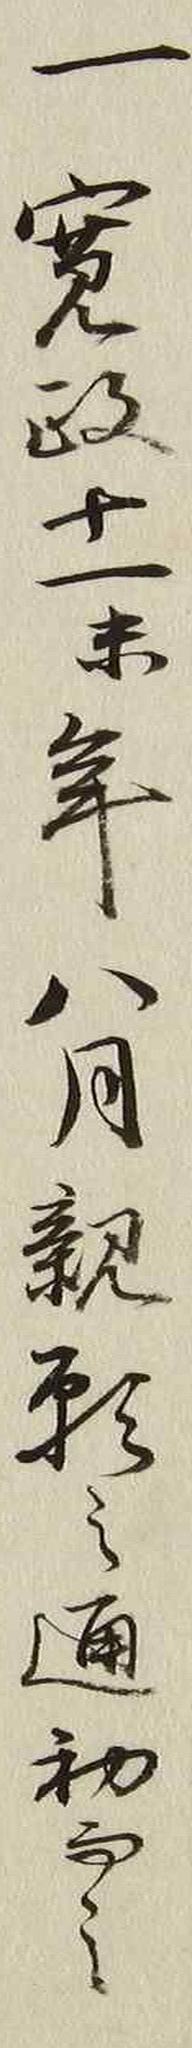一寛政十一未年八月親願之通初而之
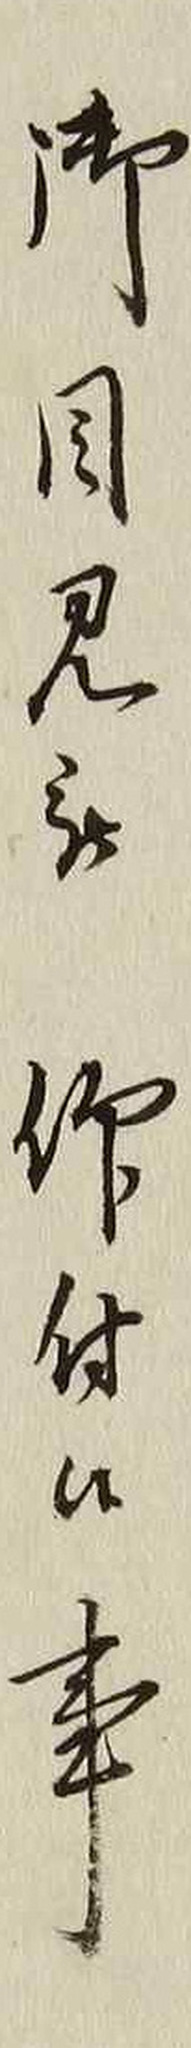御目見被仰付候事
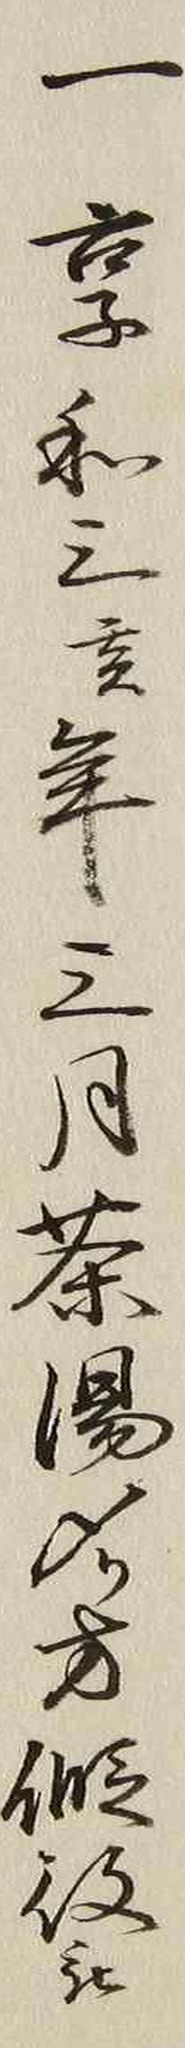一享和三亥年三月茶湯〆り方仮役被
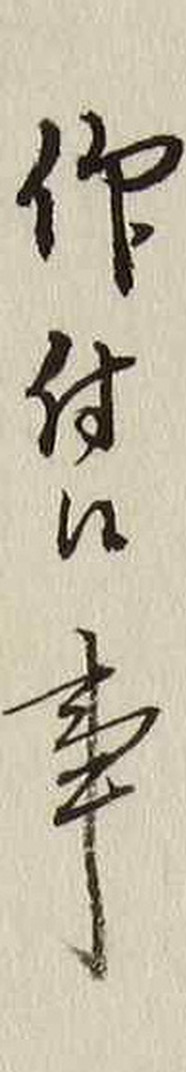仰付候事
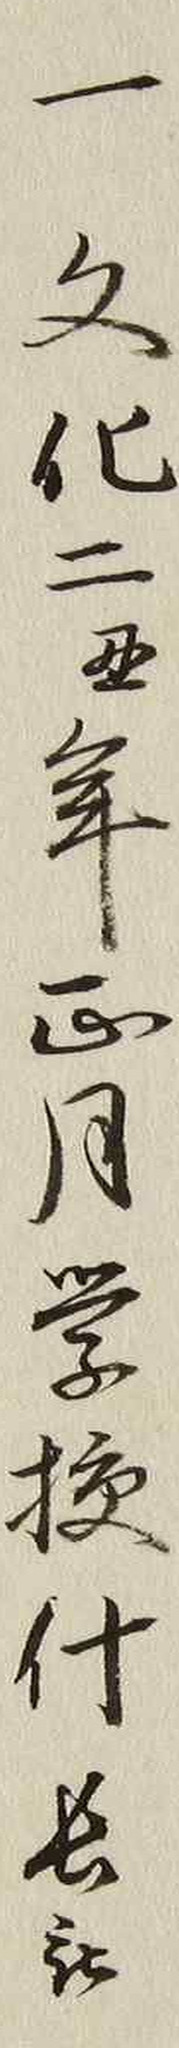一文化二丑年正月学校什長被
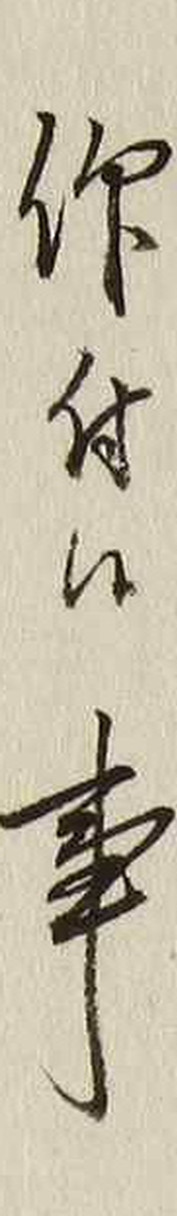仰付候事
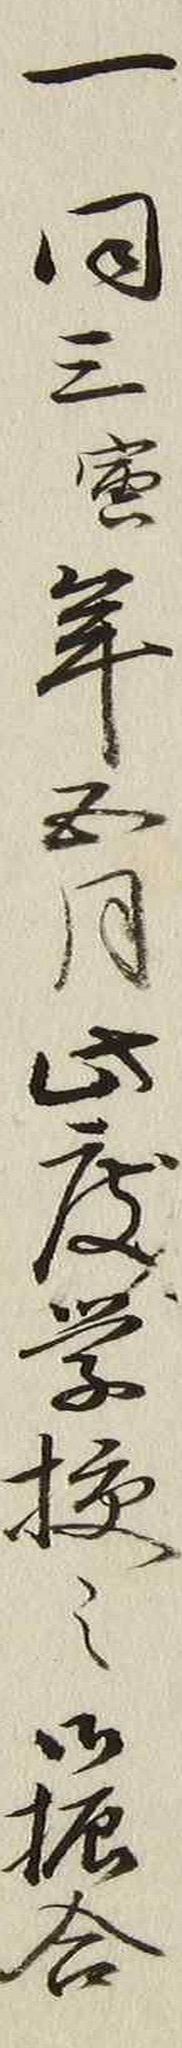一同三寅年五月此度学校之御振合
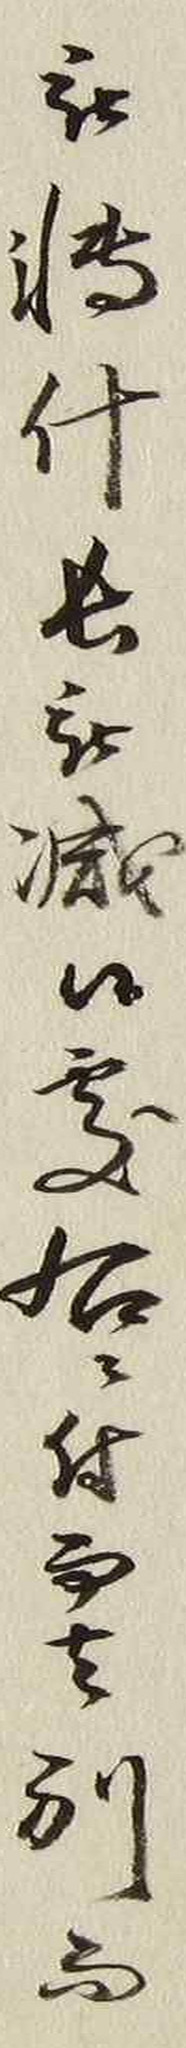被転什長被減候処右ニ付而は別而
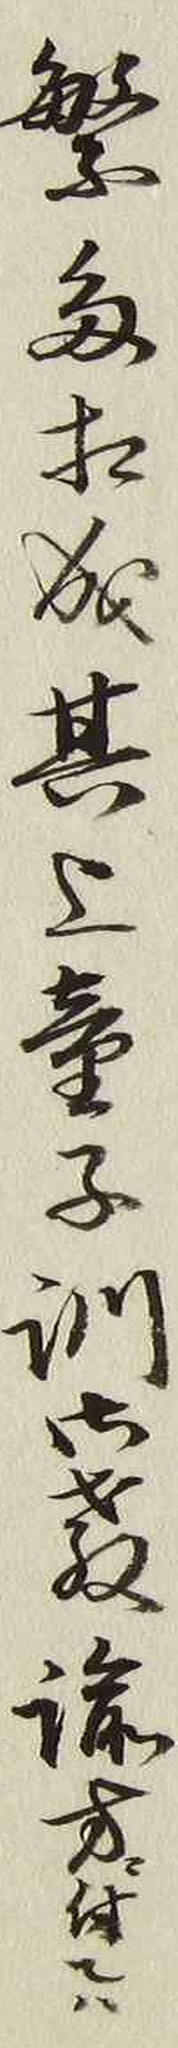繫多相成其上童子訓御教諭方ニ付てハ
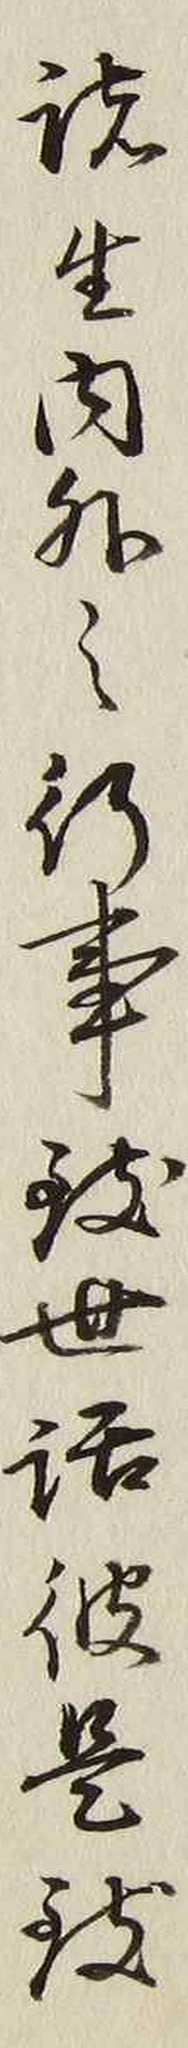諸生内外之行事致世話彼是致
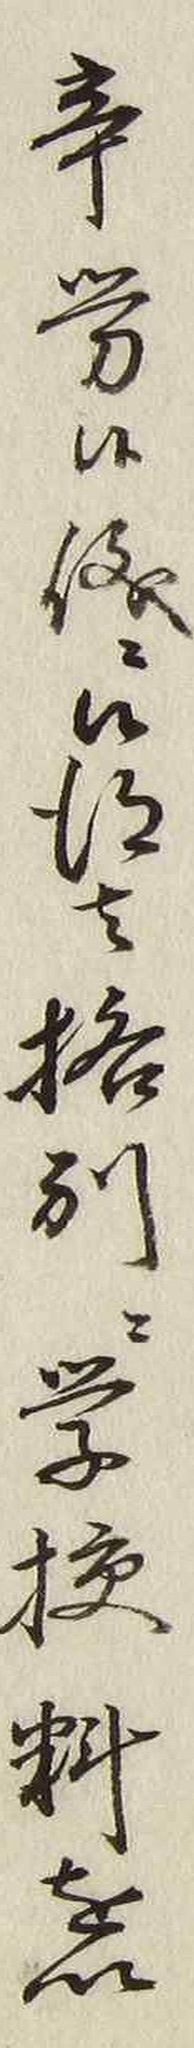辛労候儀ニ候得は格別ニ学校料を以
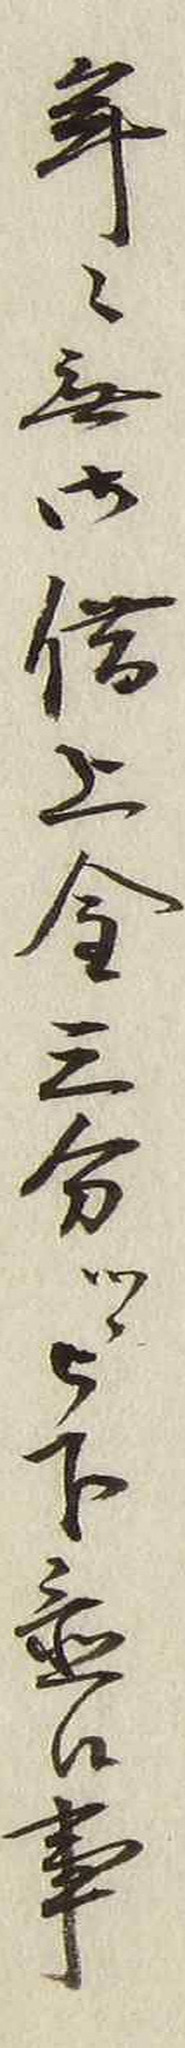年々無御借上金三分ツヽ被下置候事
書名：諸士系譜　巻之160　な之部2
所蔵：会津若松市立会津図書館
